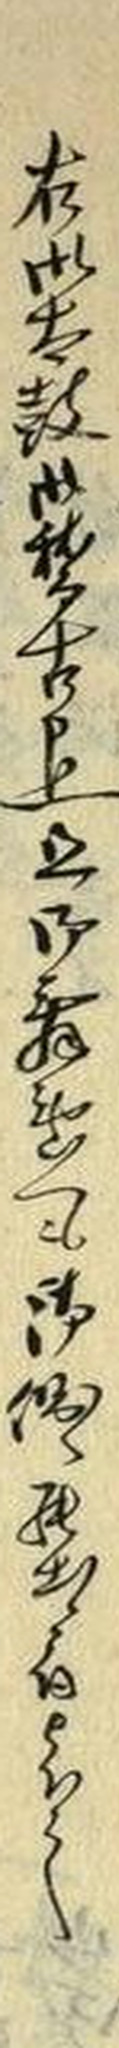右御太鼓御稽古申上御舞台へも御側へ罷出候ニ付被下之
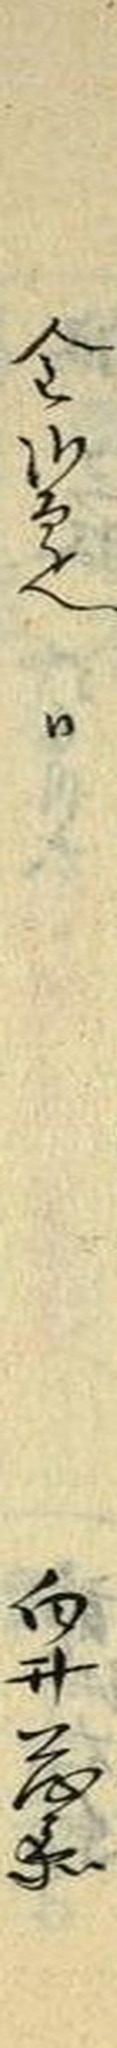金弐百疋同白井茂兵衛
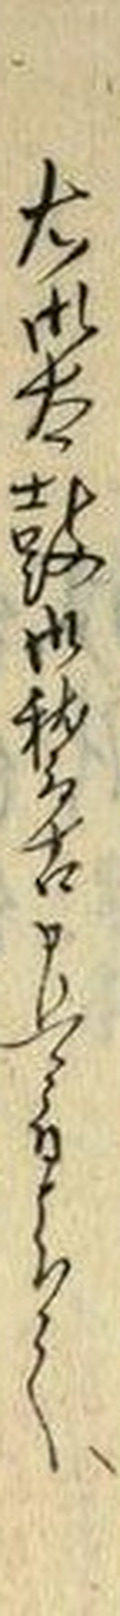右御太鼓御稽古申上候ニ付被下之
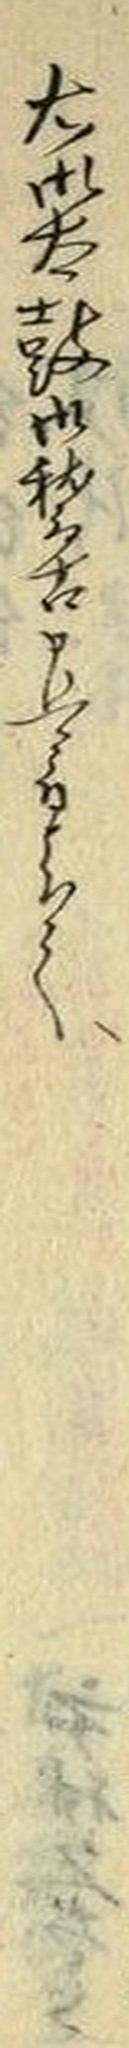右御太鼓御稽古申上候ニ付被下之
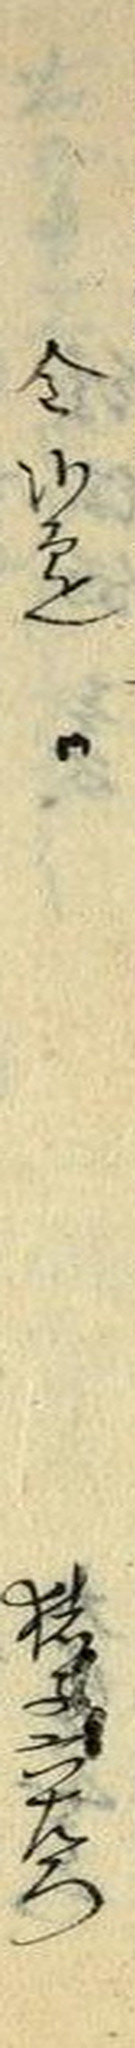金弐百疋同猪子六左衛門
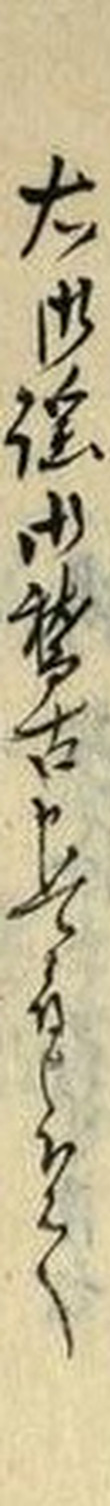右御謡御稽古申上候ニ付被下之
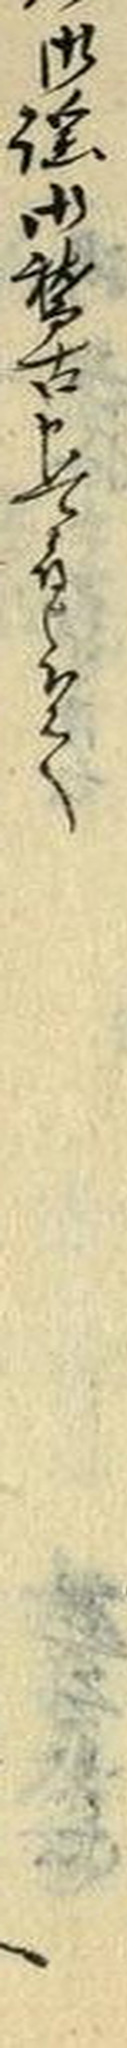右御謡御稽古申上候ニ付被下之
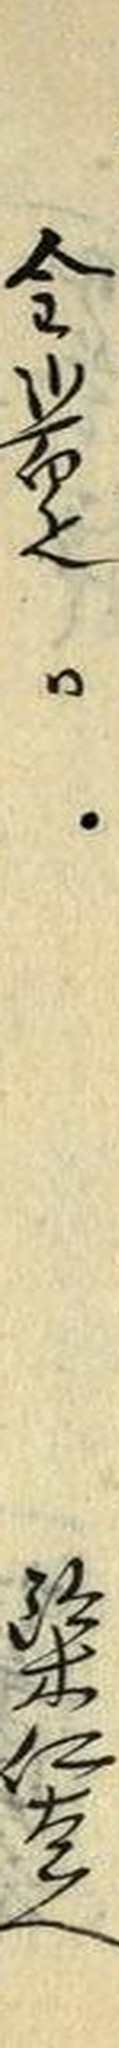金弐百疋同鈴木仁太夫
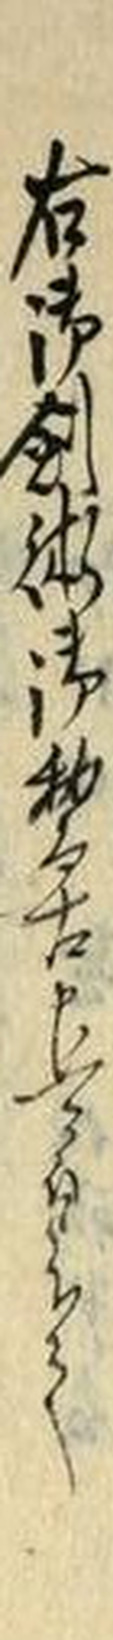右御剣術御稽古申上候ニ付被下之
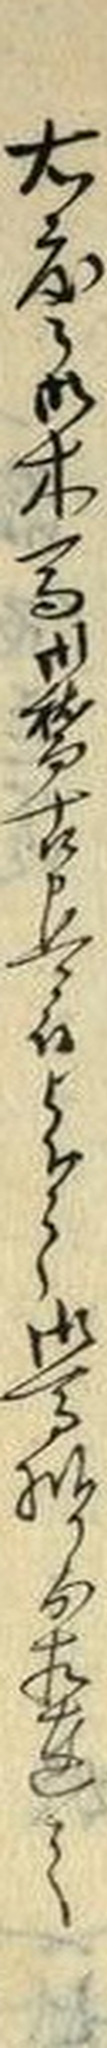右度々御木馬御稽古申上候ニ付被下之御馬掛りゟ相達之
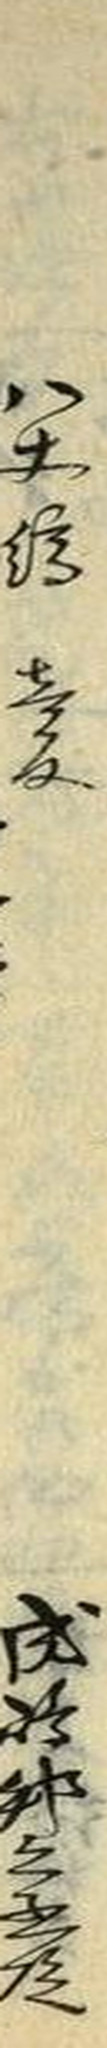八丈縞壱反成嶋邦之丞殿

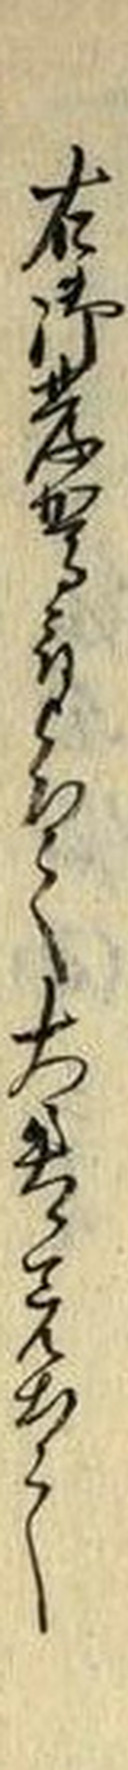右御発駕ニ付被下之大奥へ差出之
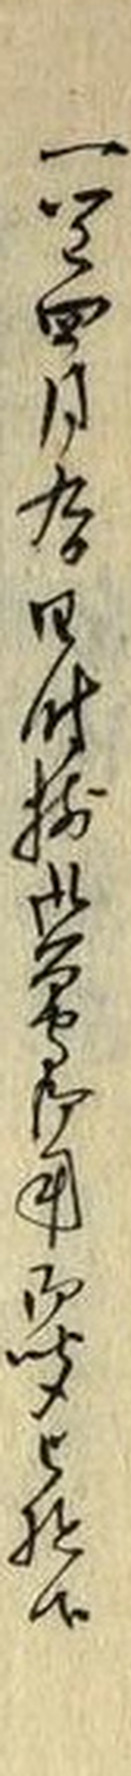一閏四月九日四時揃御留守御用御聞被遊候
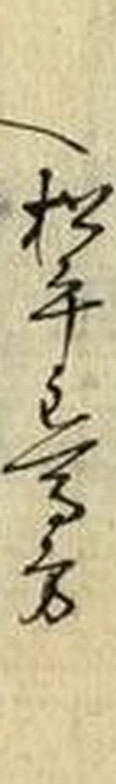松平主馬方
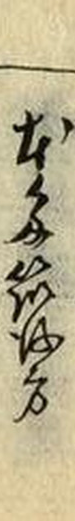本多筑後方
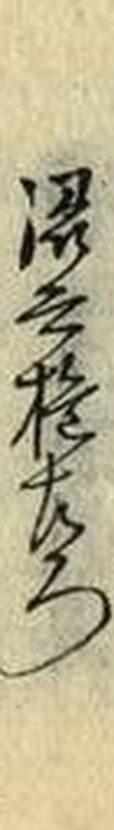渋谷権左衛門
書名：少傅日録抄（斉善付側向頭取日記、江戸并道中、初入在国、逝去後…
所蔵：福井県文書館 Fukui Prefectural Archives
